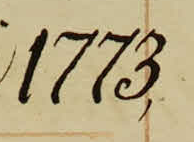1773,
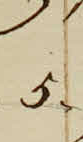5
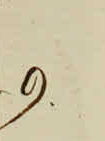9.
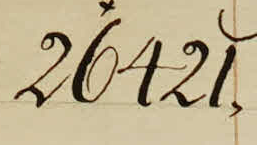26421
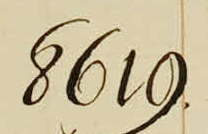8619.
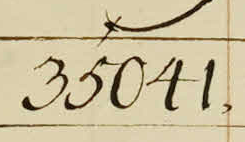35041
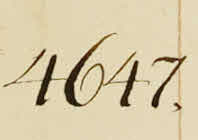4647
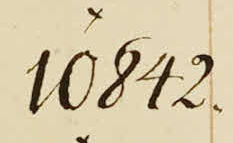10842
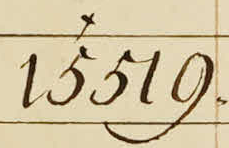15519
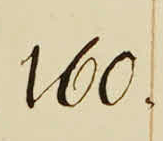160
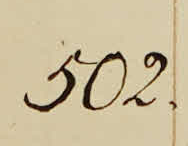502
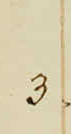3
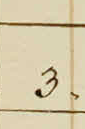3
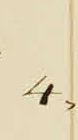4
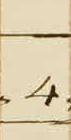4
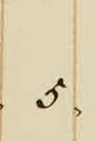5
